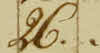26.
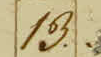13.
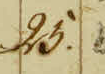25.
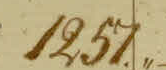1257.
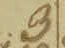3.
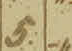5.
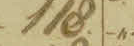118.
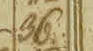36.
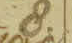8.
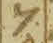7.
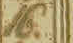16.
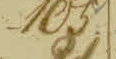105.
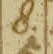8.
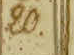20.
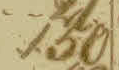150.
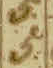5.
